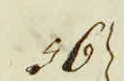56
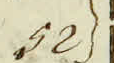52
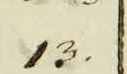13.
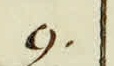9.
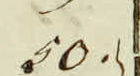50.
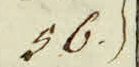56.
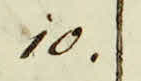10.
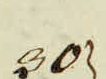30
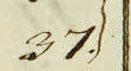37.
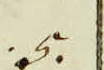5.
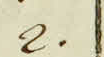2.
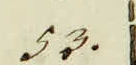53.
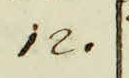12.
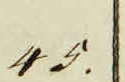45.
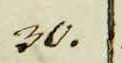30.
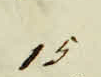15
